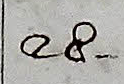28
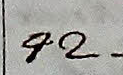42
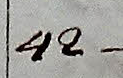42
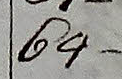64
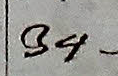34
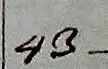43
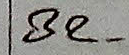32
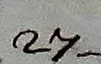27
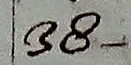38
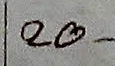20
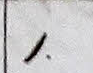1.
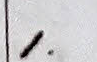1.
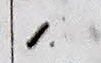1.
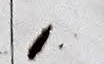1.
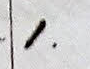1.
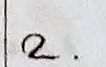2.
